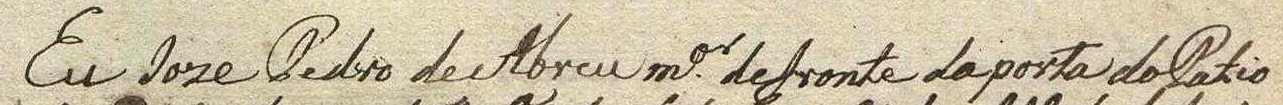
Eu Ioze Pedro de Abreu m.or defronte da porta do Patio
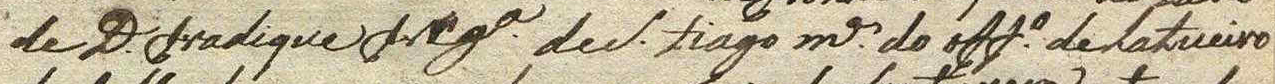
de D. fradique frrg.a de S. tiago m.e do off.o de Latueiro
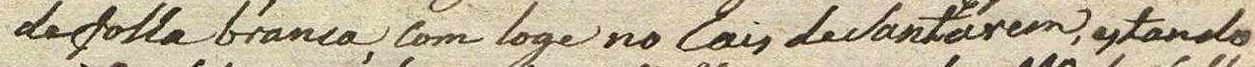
de folha branca, com loge no Cais de Santarem, estando
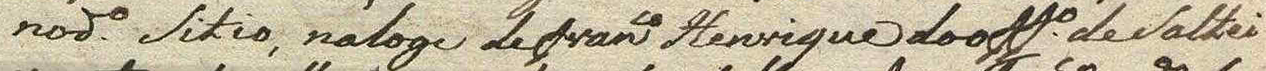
no d.o Sitio, na loge de fran.co Henrique do off.o de Saltei
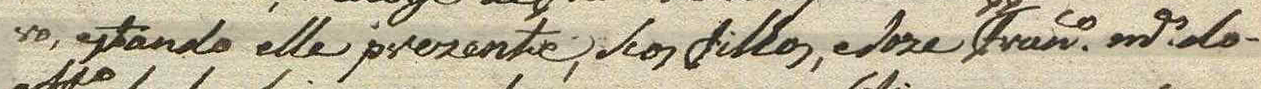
ro, estando elle prezente, seos filhos, e Ioze Fran.co m.e do
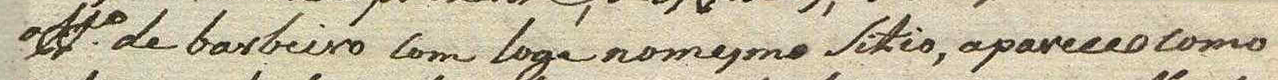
off.o de barbeiro com loge no mesmo sitio, apareceo como
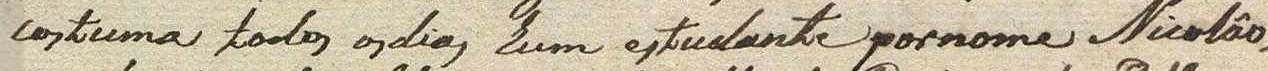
costuma todos os dias hum estudante por nome Nicoláo,
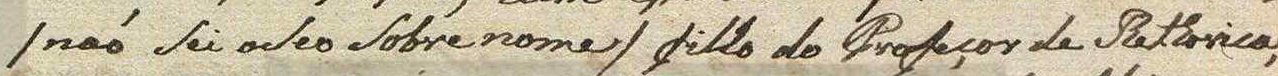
/naõ sei o seo sobrenome/ filho do Profeçor de Rethorica,
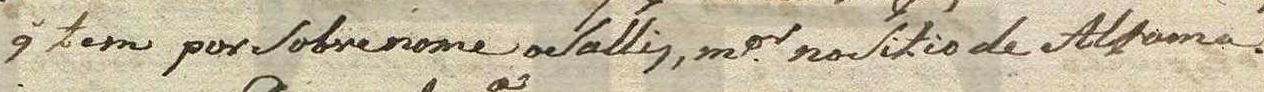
q̄ tem por sobrenome o Sallis, m.or no Sitio de Alfama.
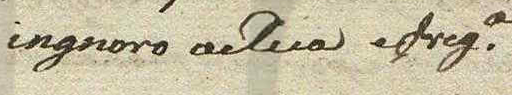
ingnoro a Rua e freg.a
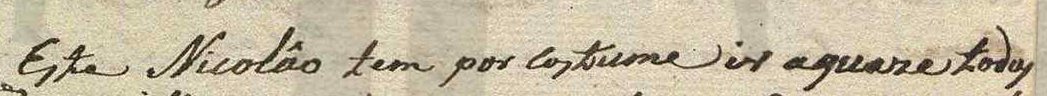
Este Nicoláo tem por costume ir a quaze todas
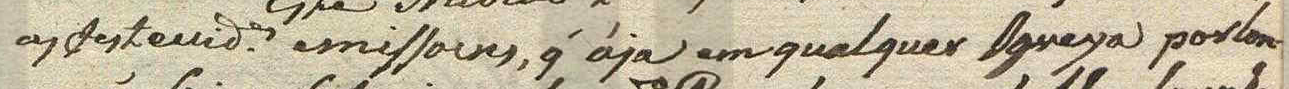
as festeuid.es e missoens, q̄ ája em qualquer Igreya por lon
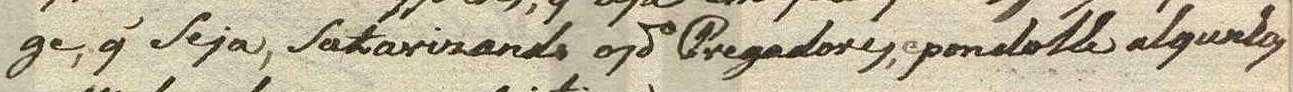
ge, q̄ seja, satarizando os d.o Pregadores, e pondolhe alqunhas
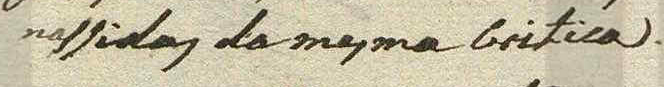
nassidas da mesma critica.
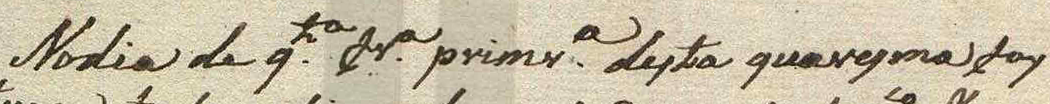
No dia de q.ta fr.a primr.a desta quaresma foy
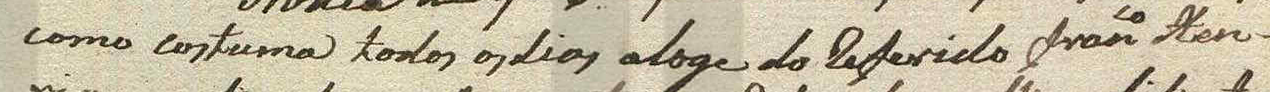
como costuma todos os dias a loge do Referido fran.co Hen
